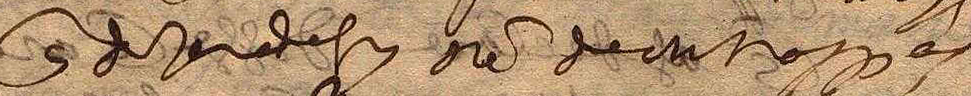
q̄ dizer de sy nē de outras pas
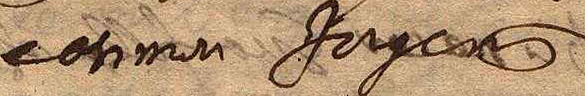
e asinou Jorge mz̄
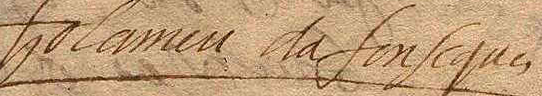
bolameu da fonsequa
